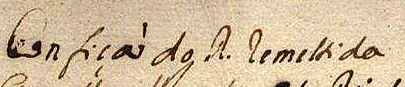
Confiçaõ do R. Remettida
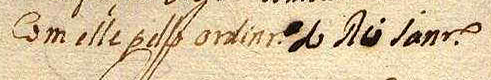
Com elle pello ordinr.o do Rio Ianr.o
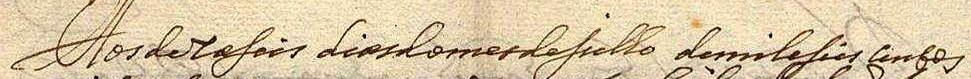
Aos dezaseis dias do mes de julho de mil e seiscentos
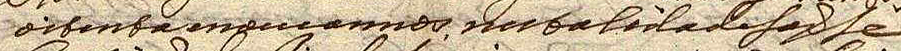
oitenta e noue annos, nesta Cidade saõ se
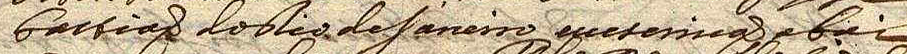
bastiaõ do Rio de janeiro eu escriuaõ abai
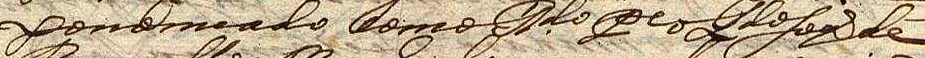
xo nomeado com o R.do Pco Ldo joaõ de
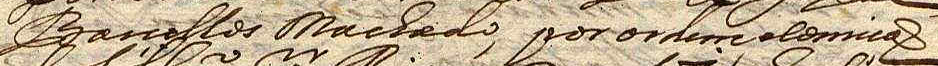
Barcellos Machado, por ordem e comiçaõ
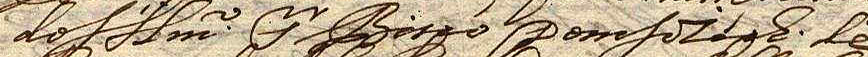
do Jllm.o sor Bispo Dom joZeph. de
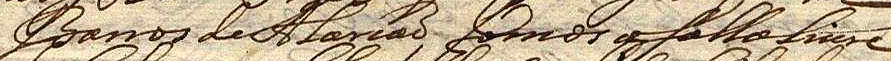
Barros de Alarcaõ, fomos a sella liure
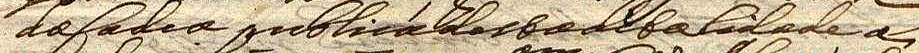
da Cadea publica desta dita Cidade a
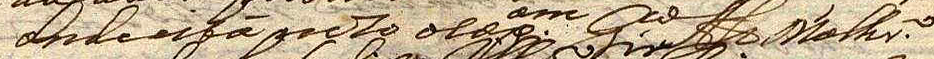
onde está prezo o cap.am Gço Alz̄ Malhr.o
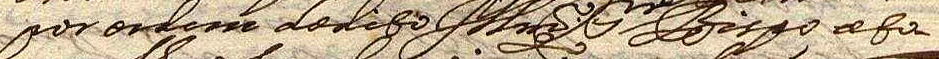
por ordem do dito Jllmo. sor Bispo, a to
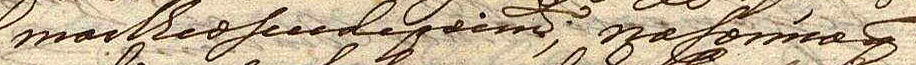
marlhe o seu depoim.to, na forma q̄
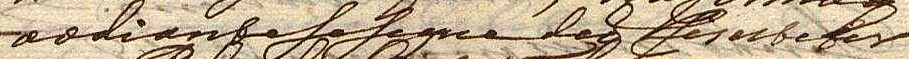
ao diante se segue do q̄ fis este ter
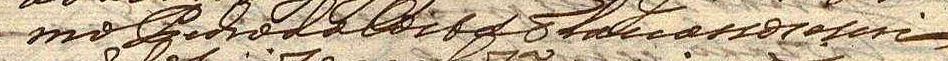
mo Pedro da Costa Trauassos escri
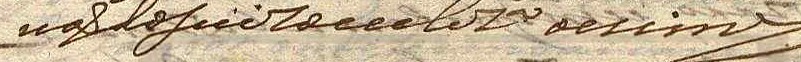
uaõ do JuiZo ecclezco o escrivj
